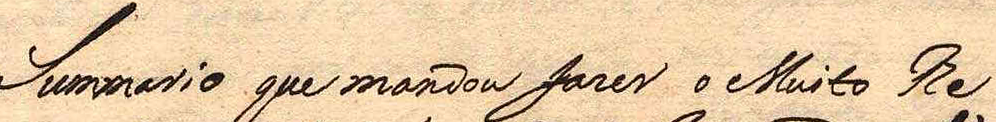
Summario que mandou fazer o Muito Re
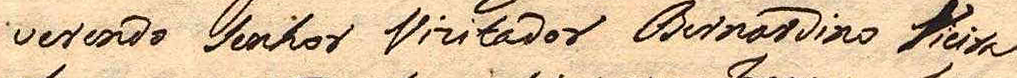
verendo senhor Vizitador Bernardino Vieira
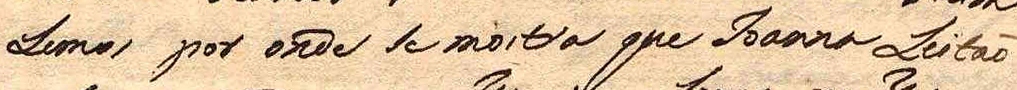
Lemos por onde se mostra que Ioanna Leitaõ
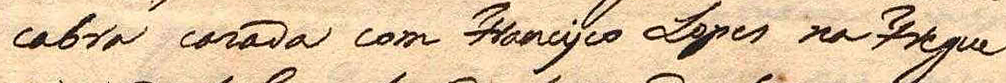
cabra cazada com Francisco Lopes na Fregue
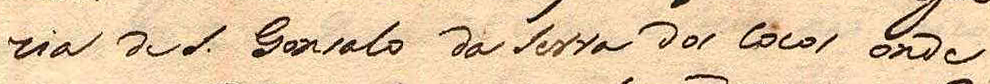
zia de S. Gonsalo da serra dos cocos onde
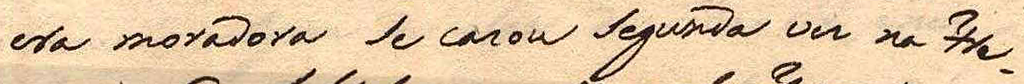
era moradora se cazou segunda vez na Fre
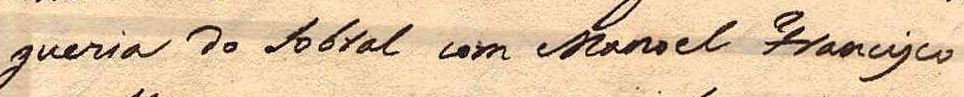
guezia do sobral com Manoel Francisco
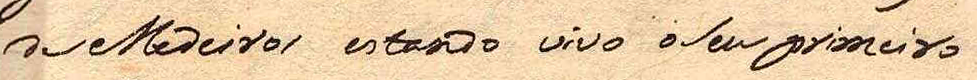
de Medeiros estando vivo o seu primeiro
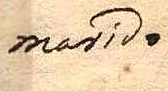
marido
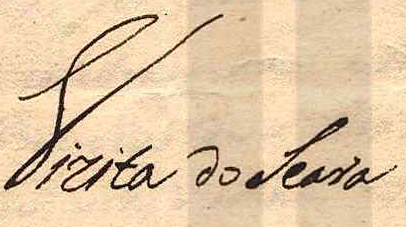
Vizita do S.caro
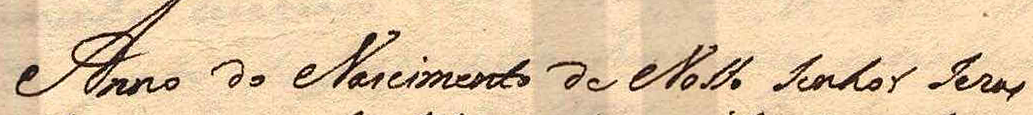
Anno do Nascimento de Nosso Senhor Iezus
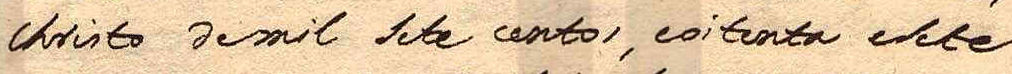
christo de mil sete centos, e oitenta e sete
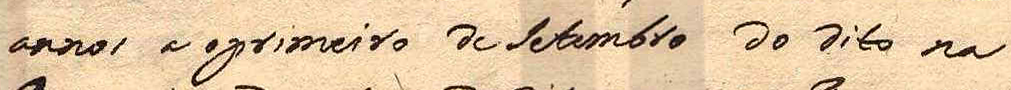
annos a o primeiro de setembro do dito na
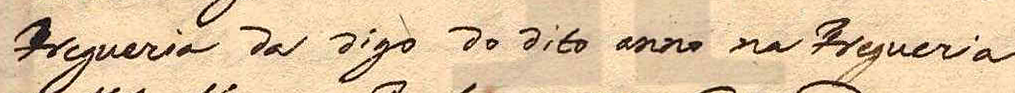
Freguezia da digo do dito anno na Freguezia
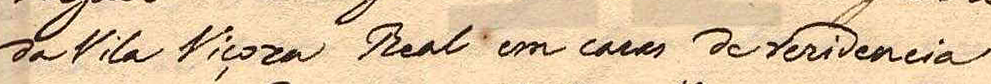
da Vila Viçoza Real em cazas de rezidencia
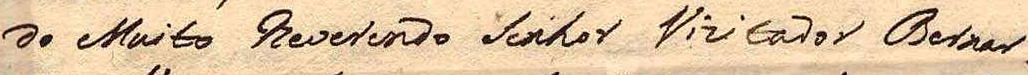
do Muito Reverendo Senhor Vizicador Bernar
